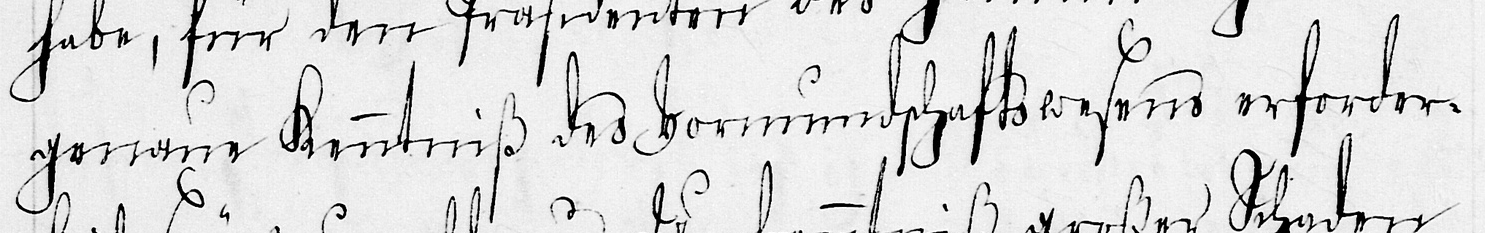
genaue Kenntniß des Vormundschaftswesens erforder¬
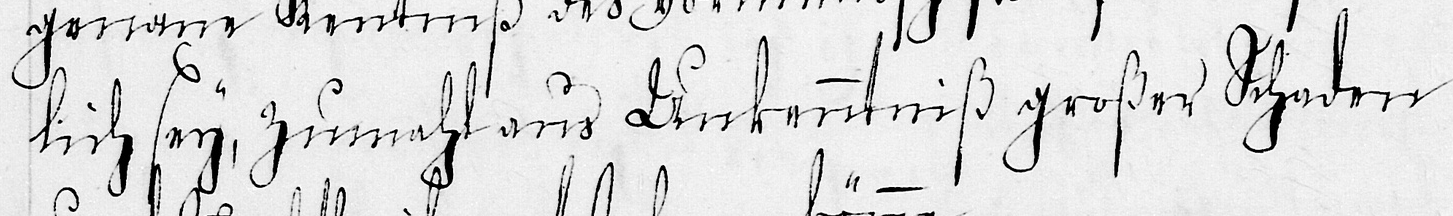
lich sey, zumahl aus Unkenntniß großer Schaden
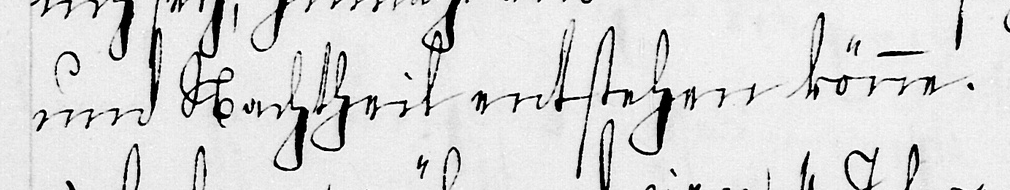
und Nachtheil entstehen könne.
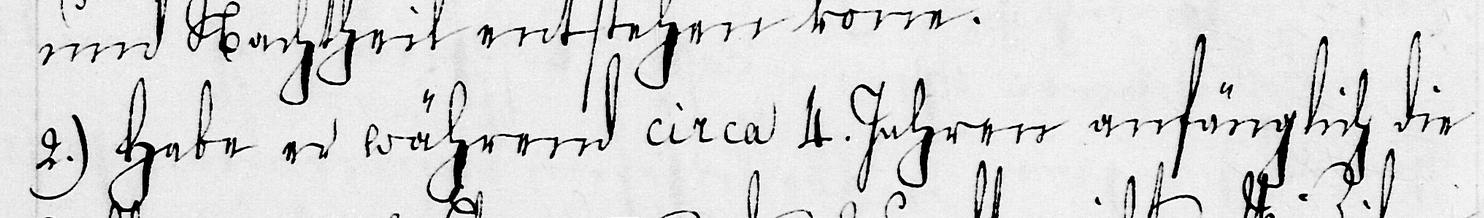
2.) Habe er während circa 4. Jahren anfänglich die
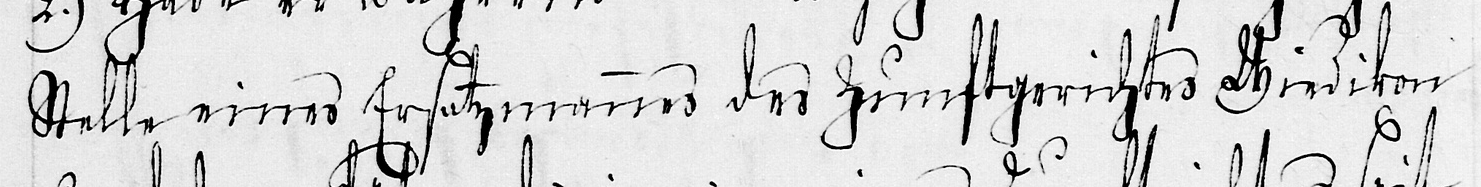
Stelle eines Ersatzmannes des Zunftgerichtes Wiedikon
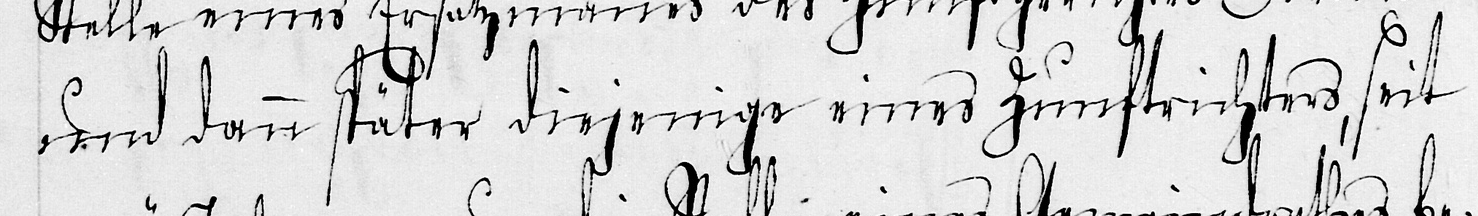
und dann später diejenige eines Zunftrichters, seit
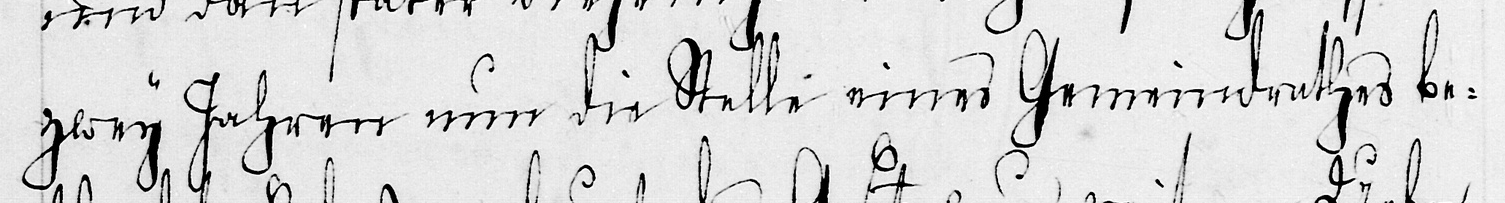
zwey Jahren nun die Stelle eines Gemeindrathes be¬
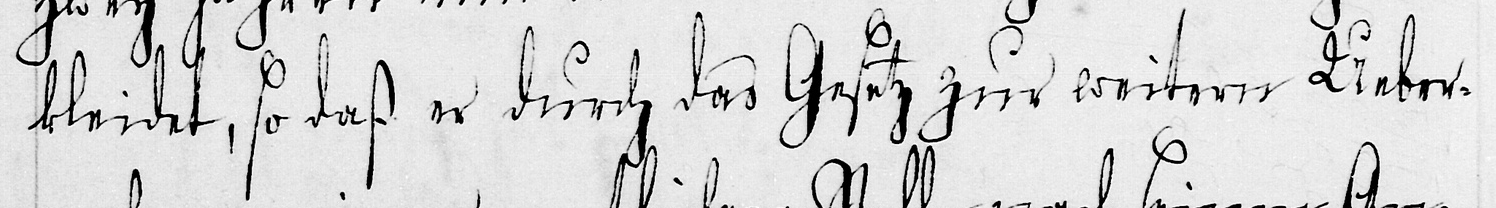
kleidet, so daß er durch das Gesetz zur weitern Ueber¬
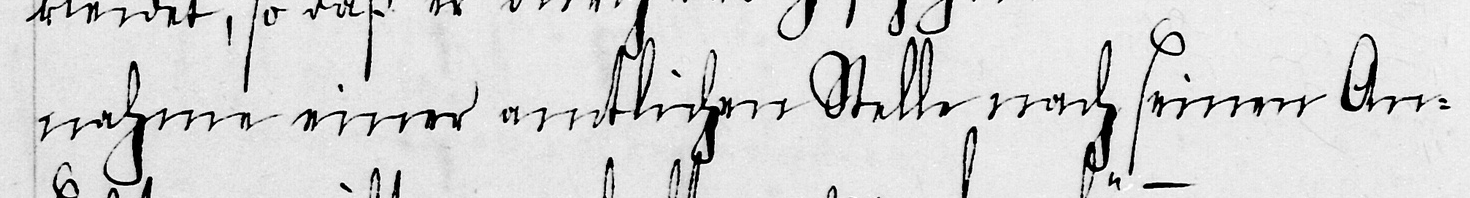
nahme einer amtlichen Stelle nach seinen An¬
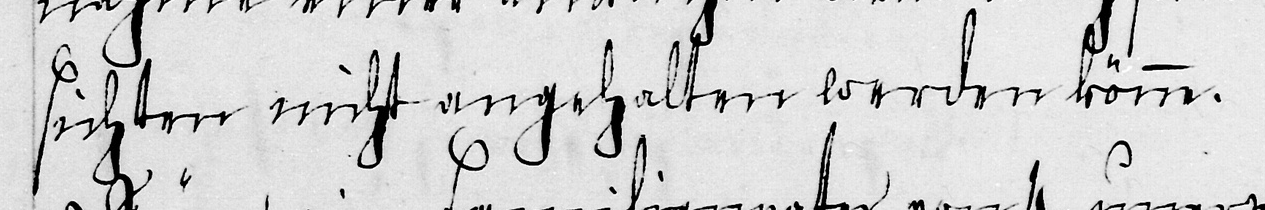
sichten nicht angehalten werden könne.
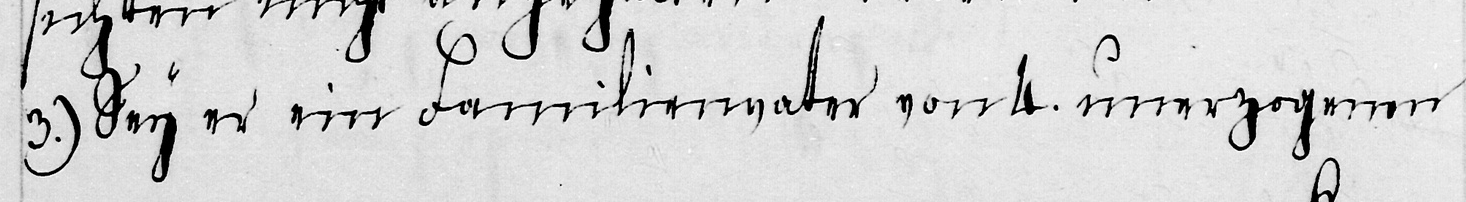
3.) Sey er ein Familienvater von 4. unerzogenen
